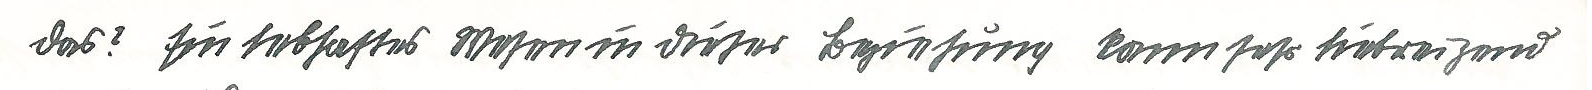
das? Ein lebhaftes Wesen in dieser Beziehung kann sehr liebreizend
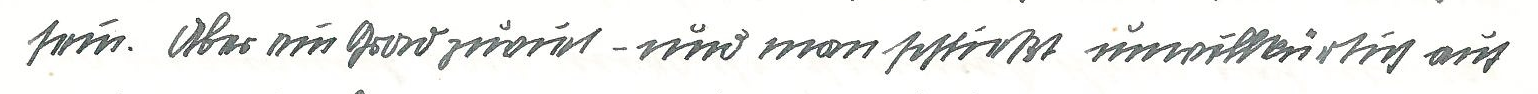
sein. Aber ein Grad zuviel – und man schließt unwillkürlich auf
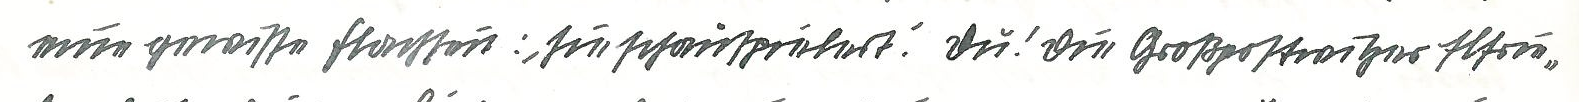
eine gewisse Flachheit: ‚sie schauspielert’. Du! Die G.er Elfrie¬
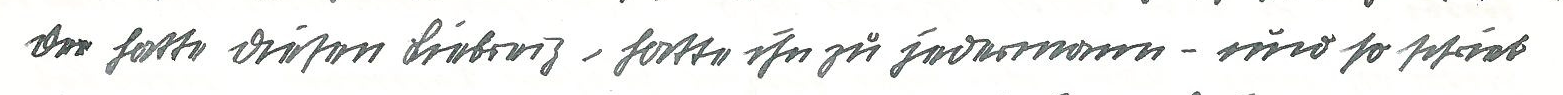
der hatte diesen Liebreiz, hatte ihn zu jedermann – und so schrieb
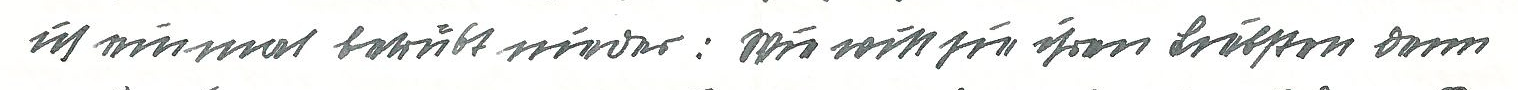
ich einmal betrübt nieder: Wie will sie ihren Liebsten denn
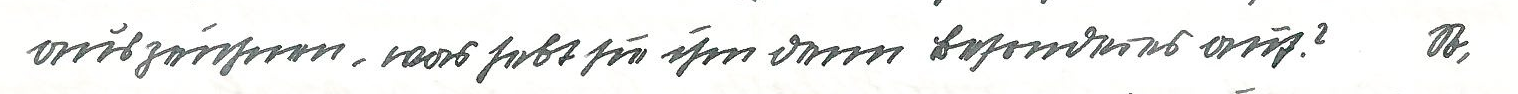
auszeichnen, was hebt sie ihm denn Besonderes auf? So,
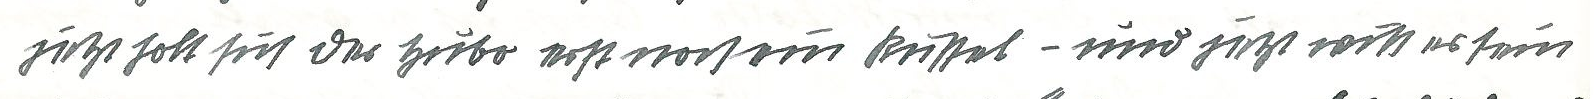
jetzt holt sich der Hubo erst noch ein Kussel – und jetzt will er sein
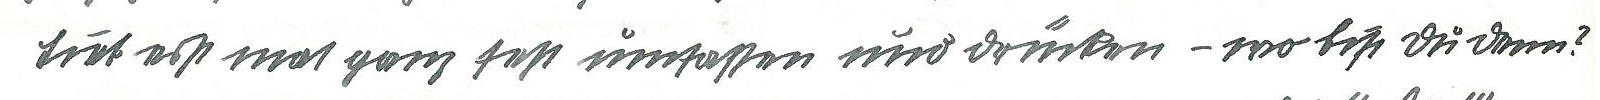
Lieb erst mal ganz fest umfassen und drücken – wo bist Du denn?
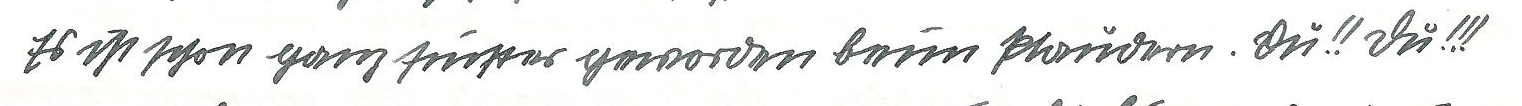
Es ist schon ganz finster geworden beim Plaudern. Du!! Du!!!
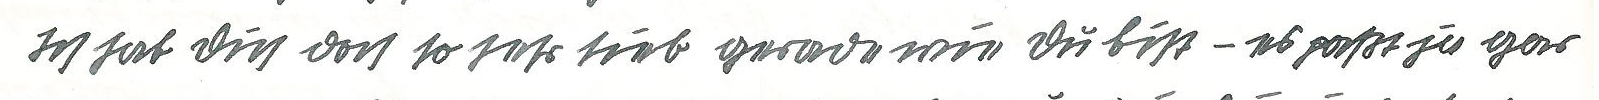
Ich hab Dich doch so sehr lieb grade wie Du bist – es paßt ja gar
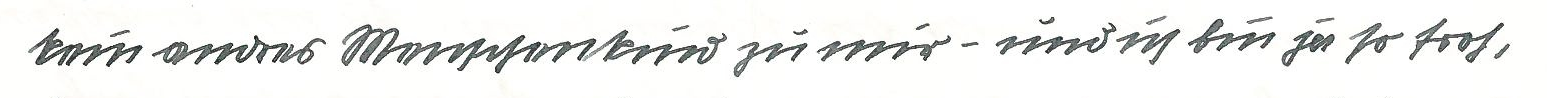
kein andres Menschenkind zu mir – und ich bin ja so froh,
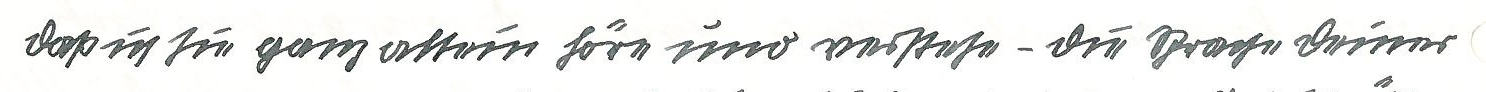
daß ich sie ganz allein höre und verstehe – die Sprache Deiner
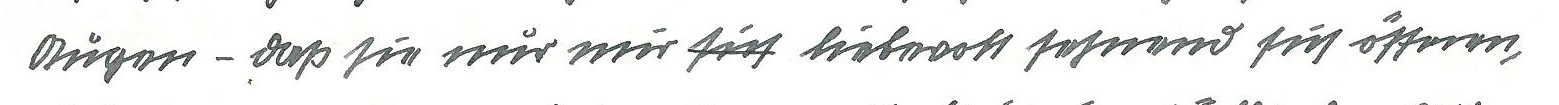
Augen – daß sie nur mir sich liebevoll sehnend sich öffnen,
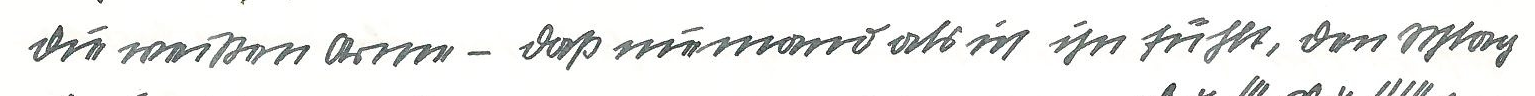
die weißen Arme – daß niemand als ich ihn fühlt, den Schlag
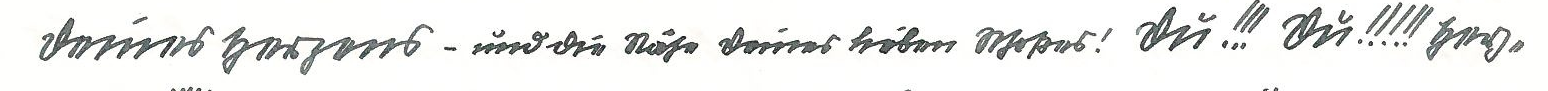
Deines Herzens – und die Nähe Deines lieben Schoßes! Du!!! Du!!!!! Herz¬
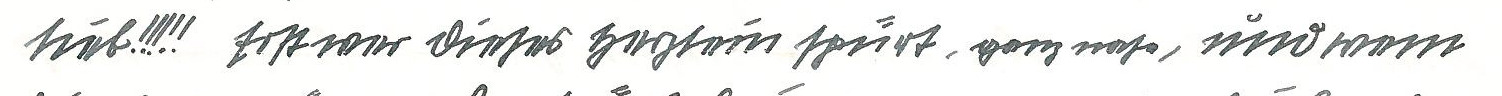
lieb!!!!! Erst wer dieses Herzlein spürt, ganz nahe, und wenn
